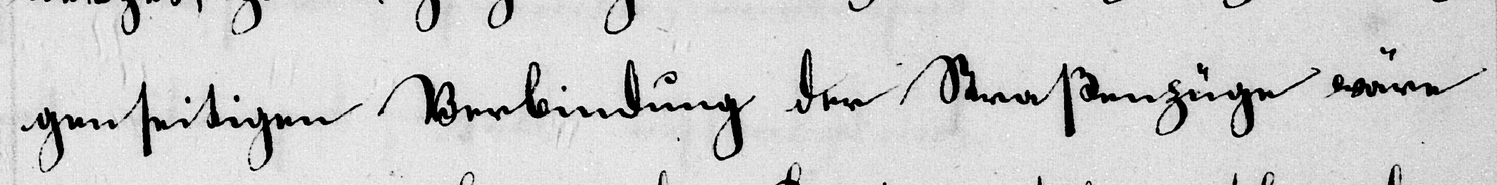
genseitigen Verbindung der Straßenzüge wäre
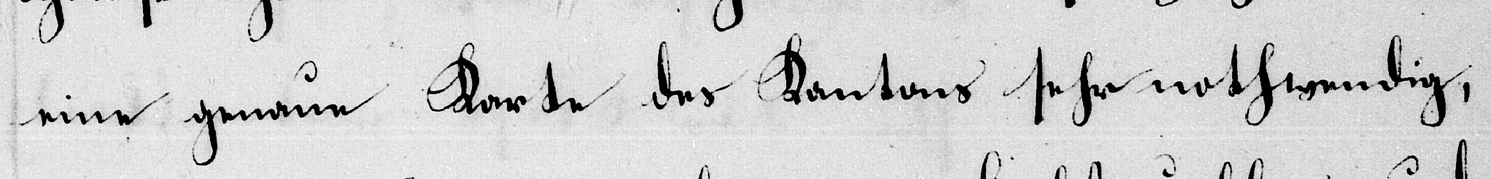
eine genaue Karte des Kantons sehr nothwendig,
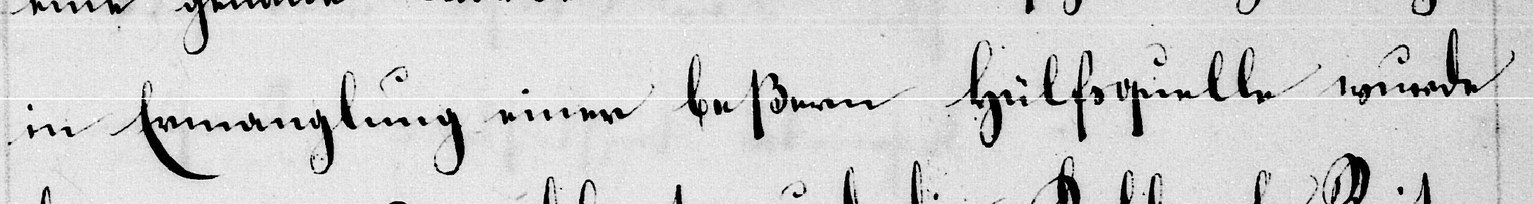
in Ermanglung einer beßern Hülfsquelle wurde
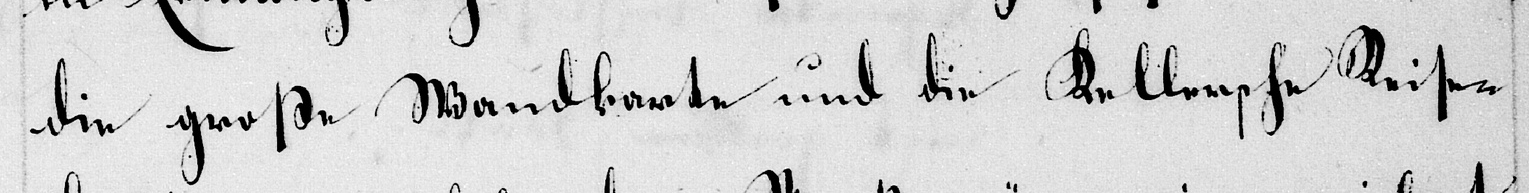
die große Wandkarte und die Kellersche Reise¬
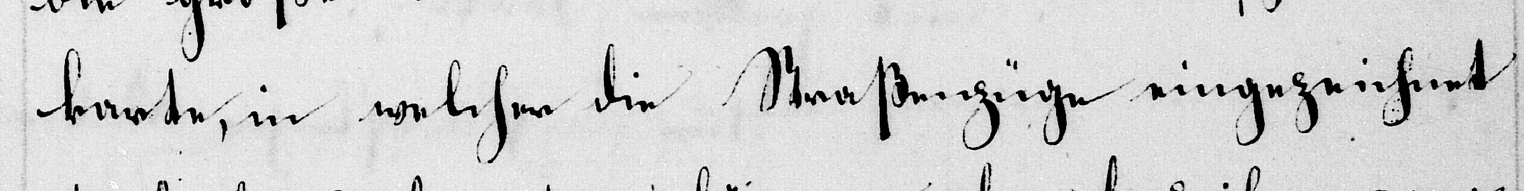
karte, in welcher die Straßenzüge eingezeichnet
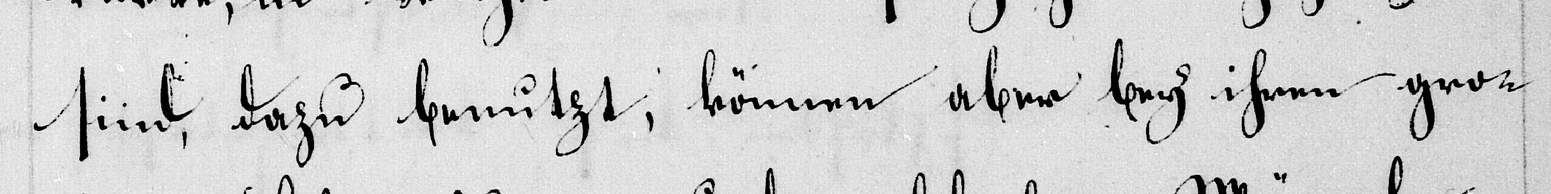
sind, dazu benutzt, können aber bey ihren gro¬
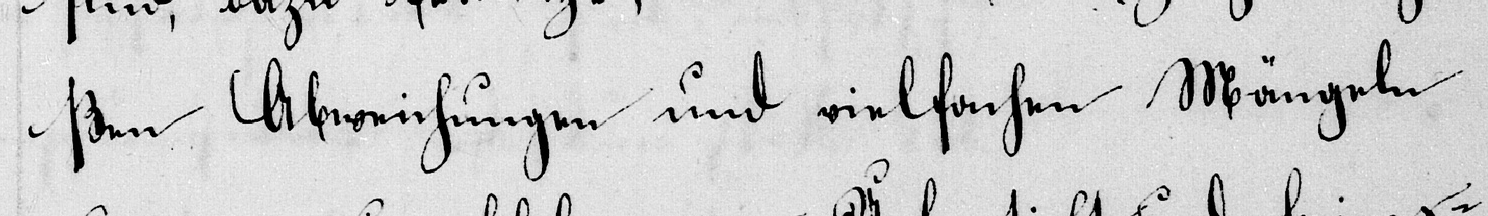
ßen Abweichungen und vielfachen Mängeln
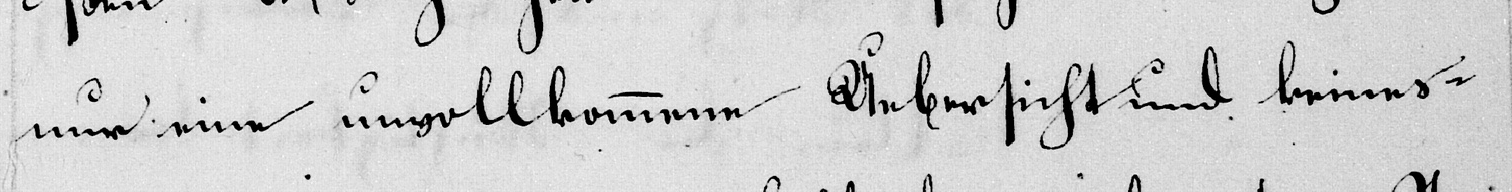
nur eine unvollkommene Uebersicht und keines¬
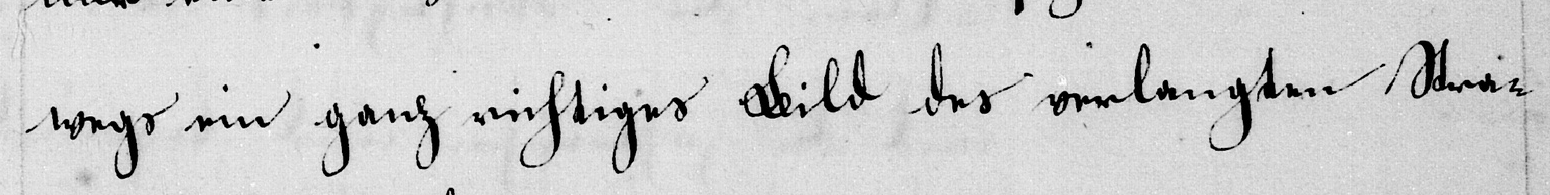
wegs ein ganz richtiges Bild des verlangten Stra¬
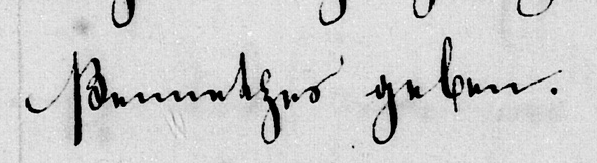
ßennetzes geben.
